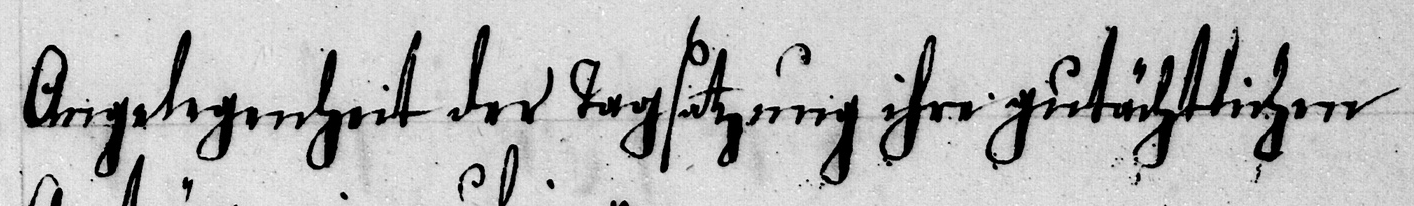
Angelegenheit der Tagsatzung ihre gutächtlichen
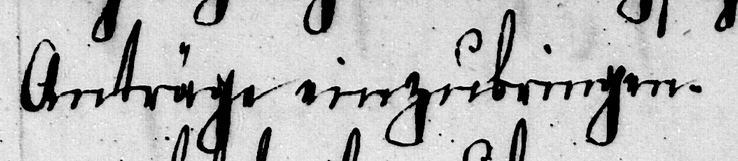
Anträge einzubringen.
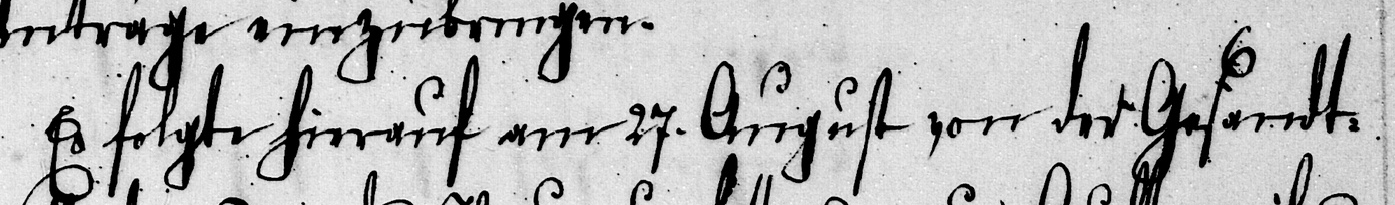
Es folgte hierauf am 27. August von der Gesandt¬
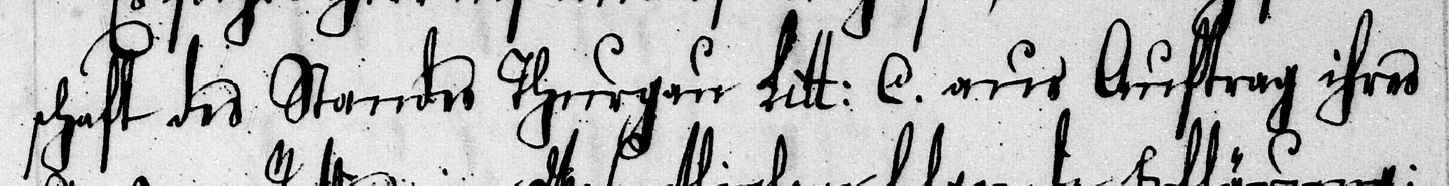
schaft des Standes Thurgau Litt: C. aus Auftrag ihres
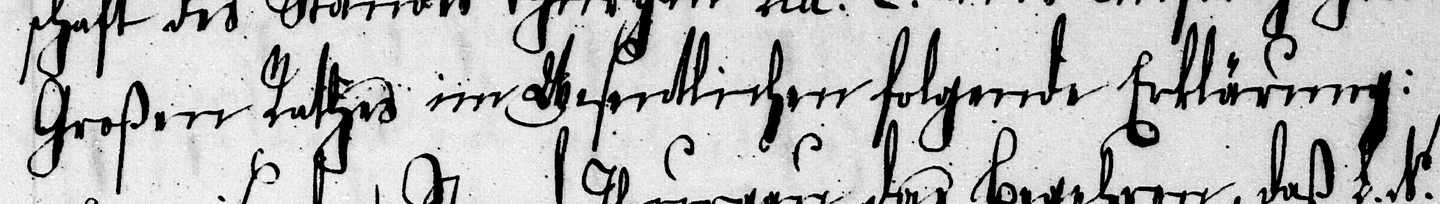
Großen Rathes im Wesentlichen folgende Erklärung:
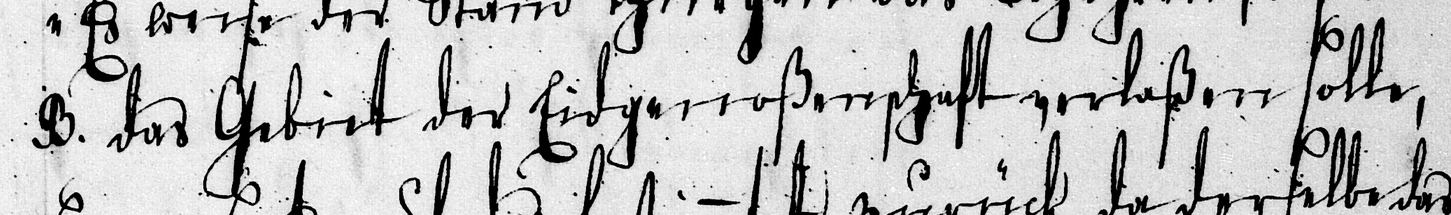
B. das Gebiet der Eidgenoßenschaft verlaßen solle,
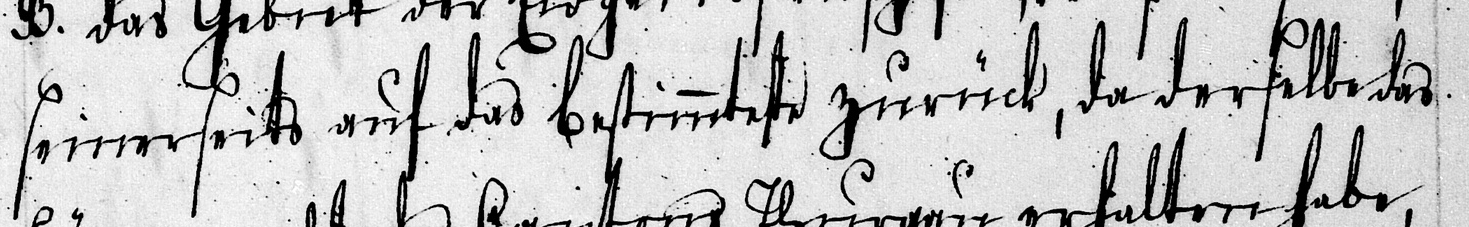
seinerseits auf das Bestimmteste zurück, da derselbe das
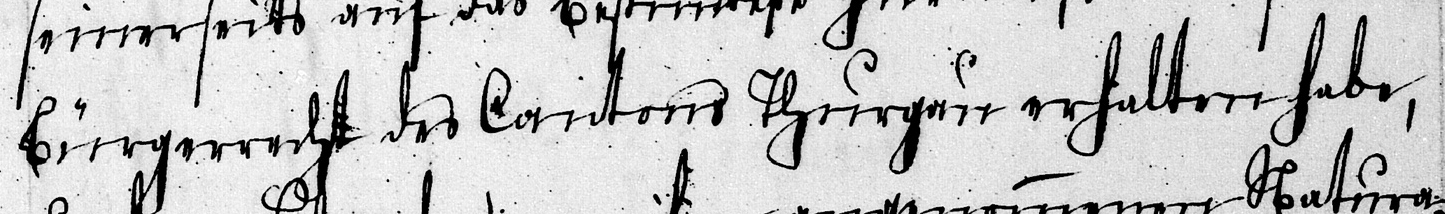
Bürgerrecht des Cantons Thurgau erhalten habe,
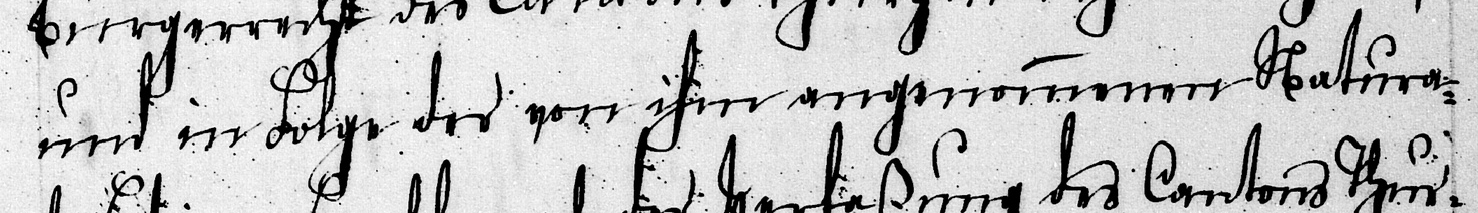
und in Folge der von ihm angenommenen Natura¬
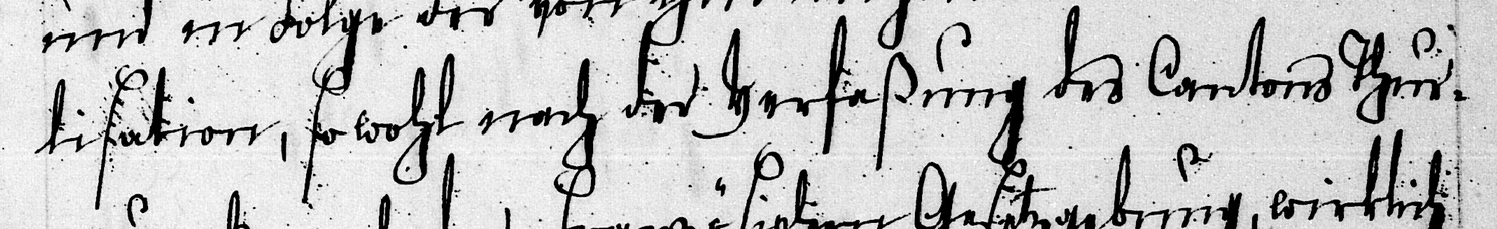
lisation, sowohl nach der Verfaßung des Cantons Thur¬
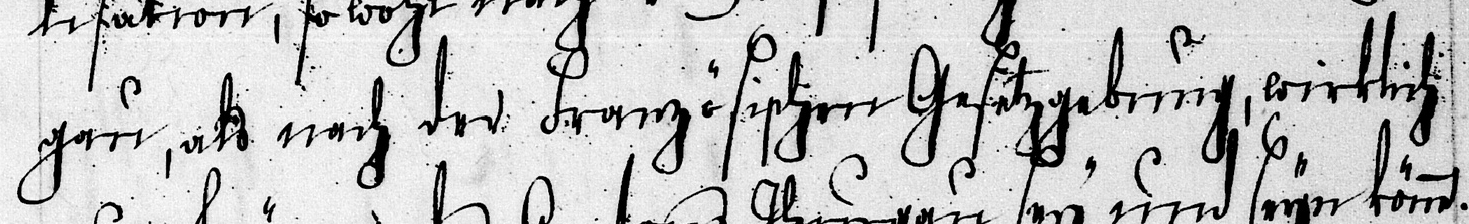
gau, als nach der Französischen Gesetzgebung, wirklich
